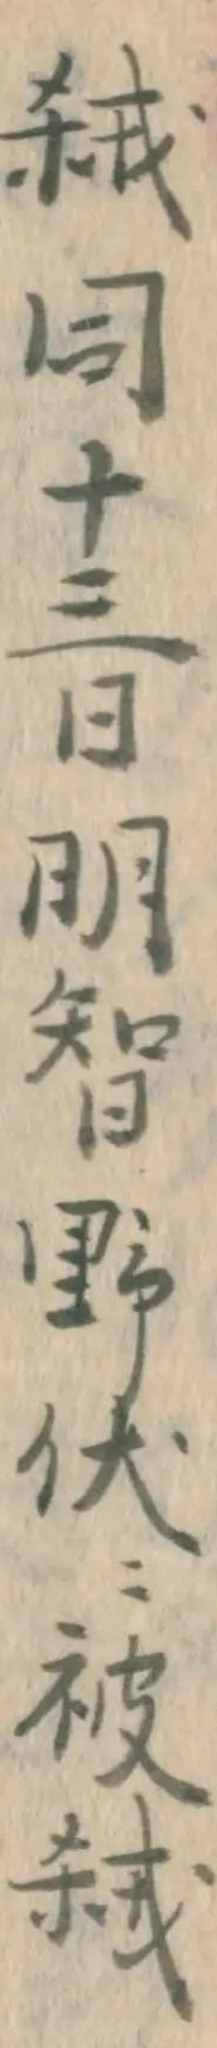弑同十三日明智野伏ニ被弑
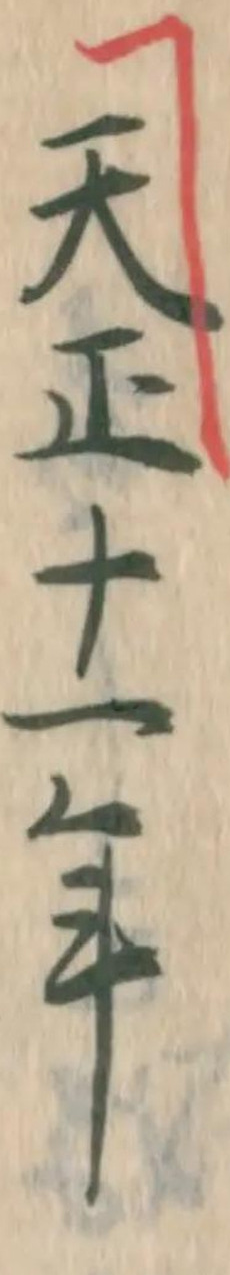天正十一年
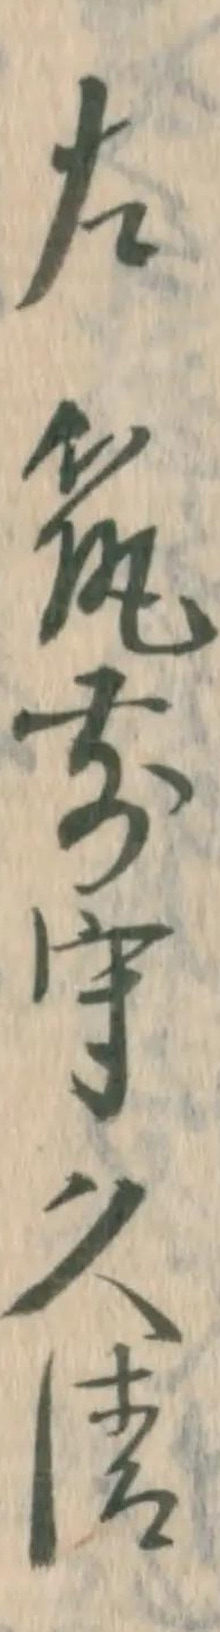左筑前守久清
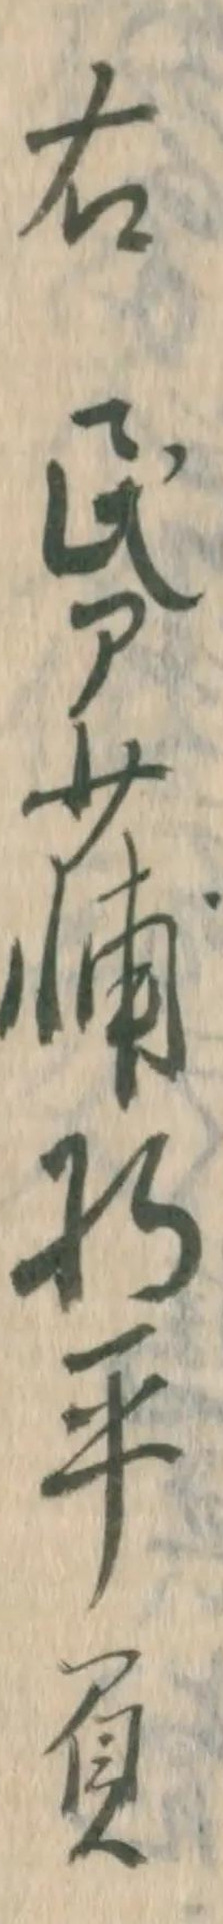右民部少輔将平負
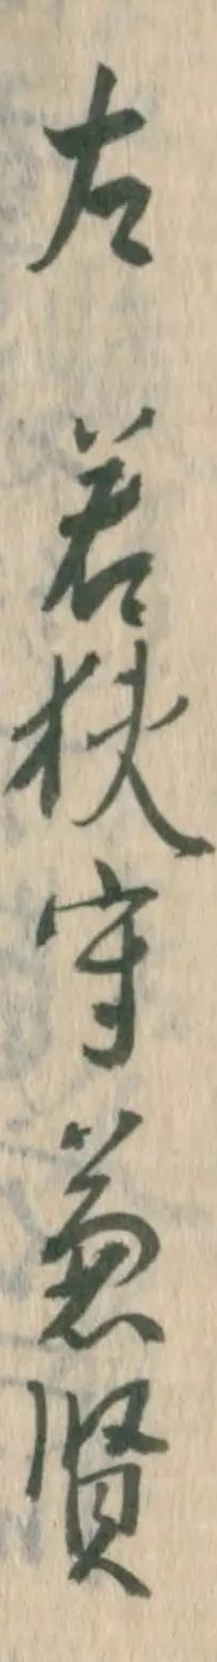左若狭守兼賢
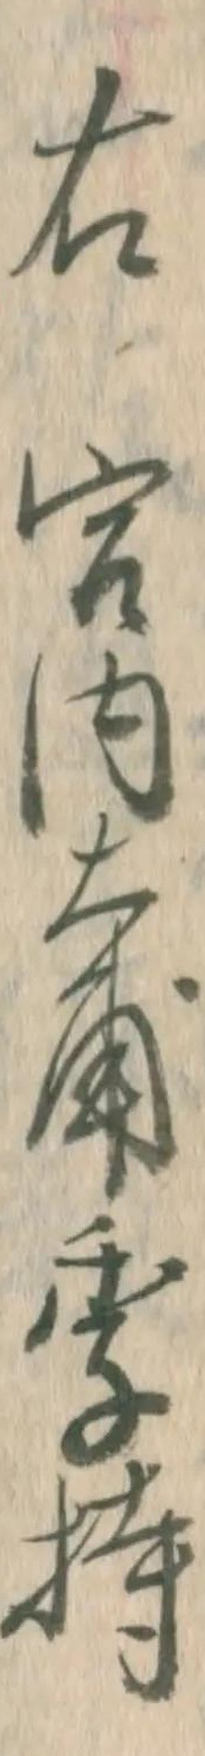右宮内大輔季持
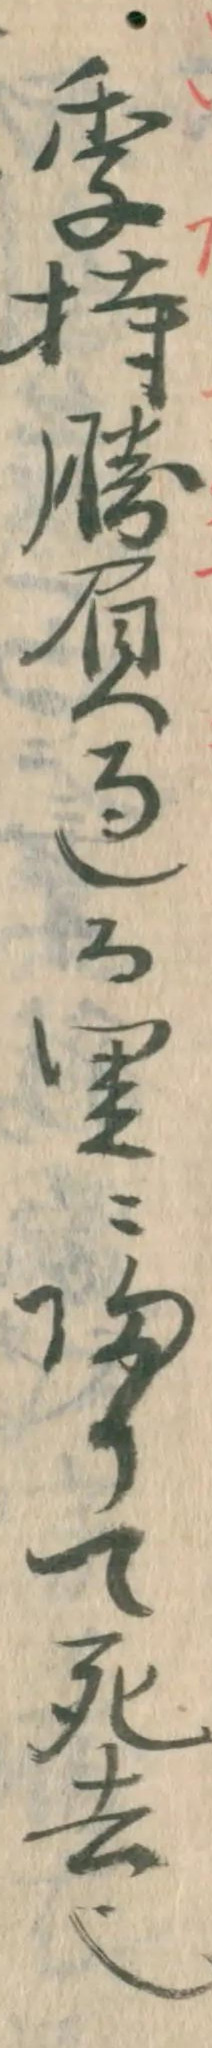季持勝負過而里ニ帰りて死去也
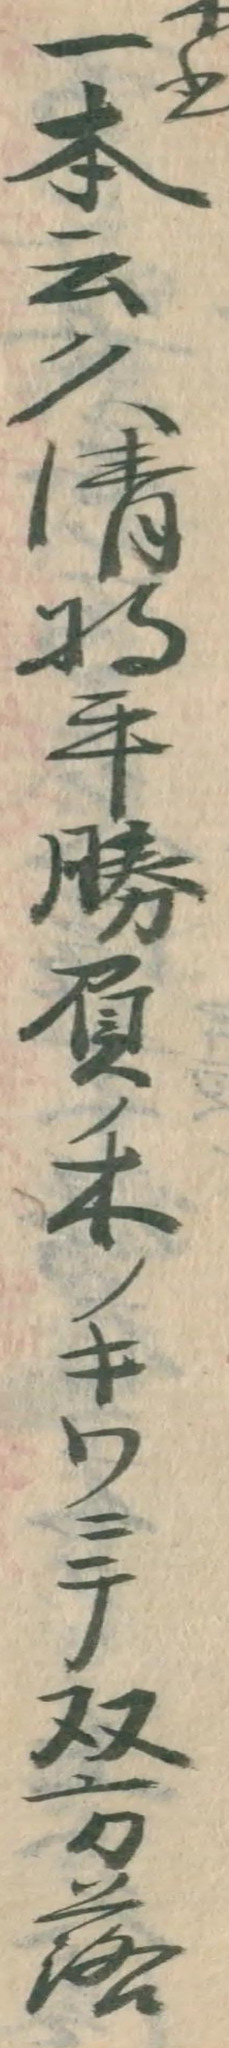一本云久清将平勝負ノ木ノキワニテ双方落

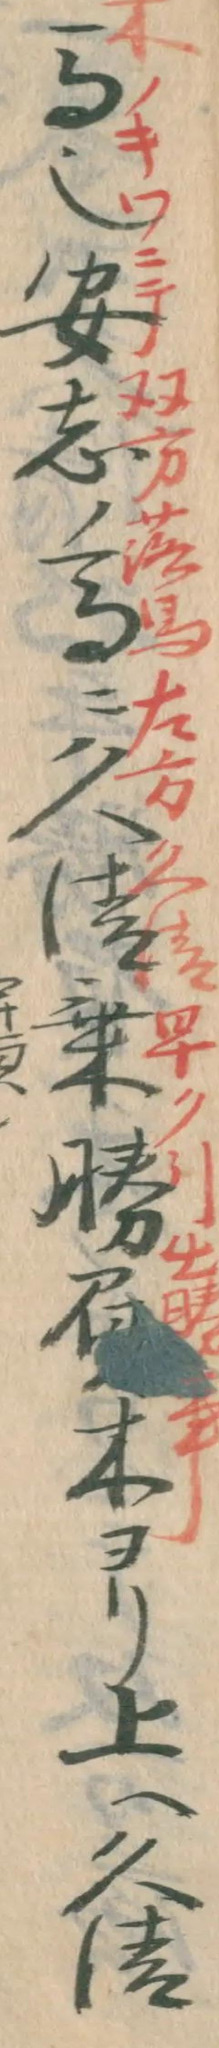馬也安志ノ馬ニ久清乗勝負木ヨリ上ヘ久清
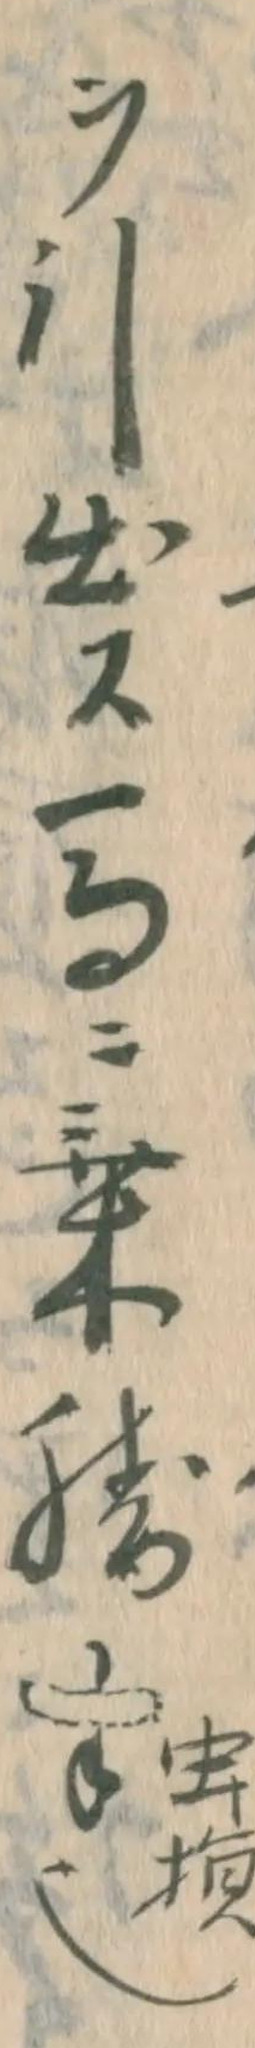ヲ引出ス馬ニ乗勝也
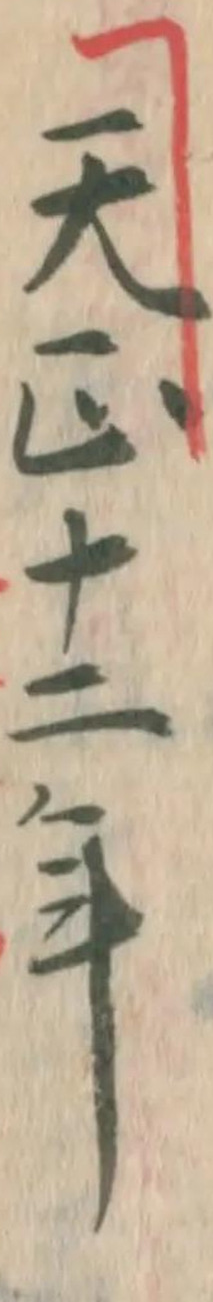天正十二年
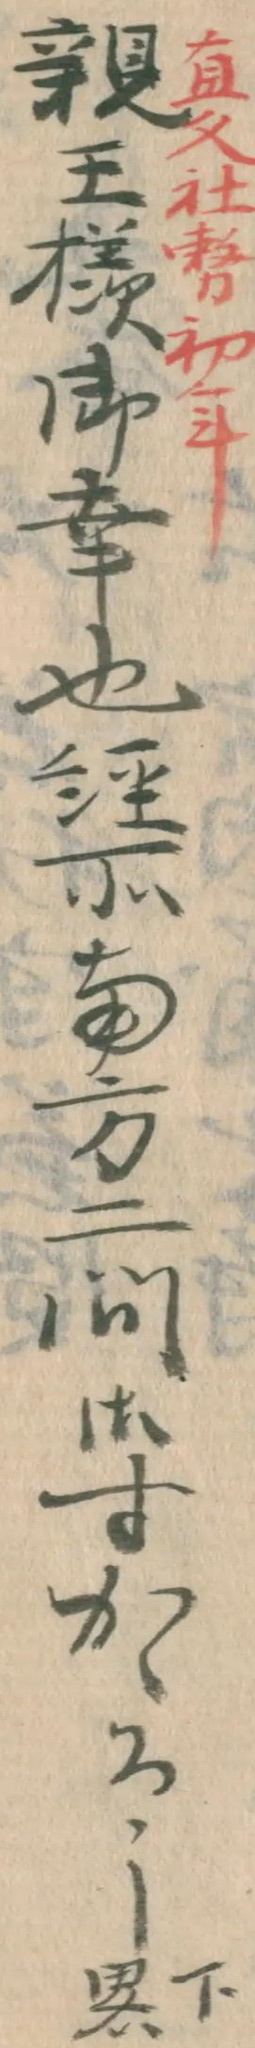親王様御幸也経所南方二間御すかゝろし下略
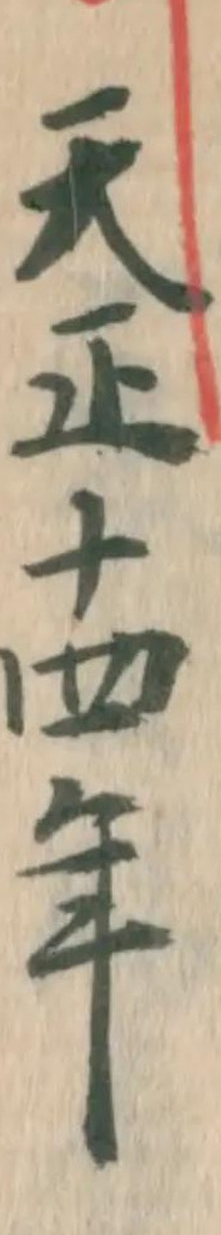天正十四年
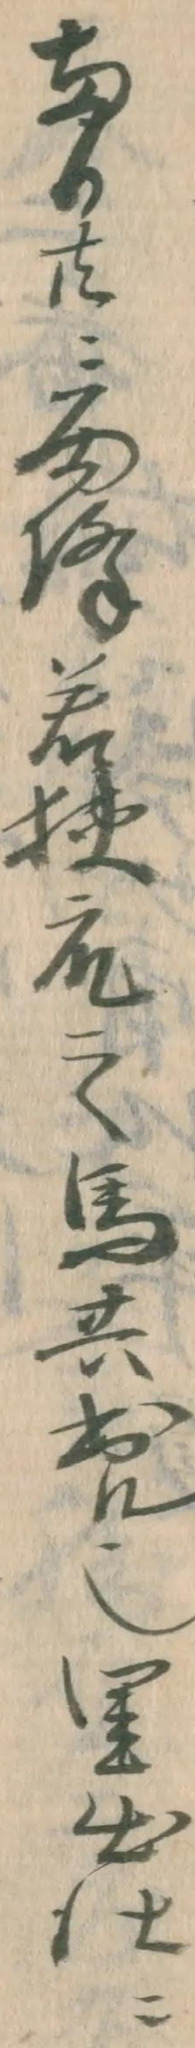両日共ニ雨降若狭衆之馬共出ル也里出仕ニ
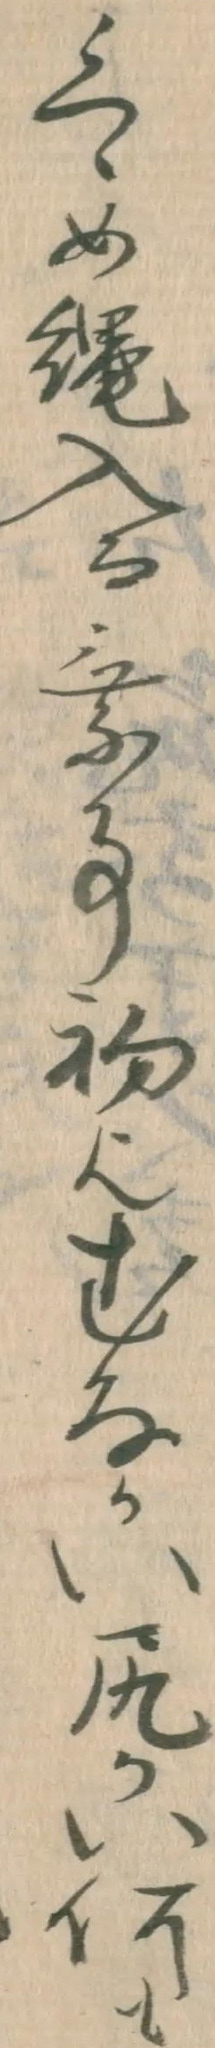候ハヽ如縄入而乗事初也むなかい尻かい何も
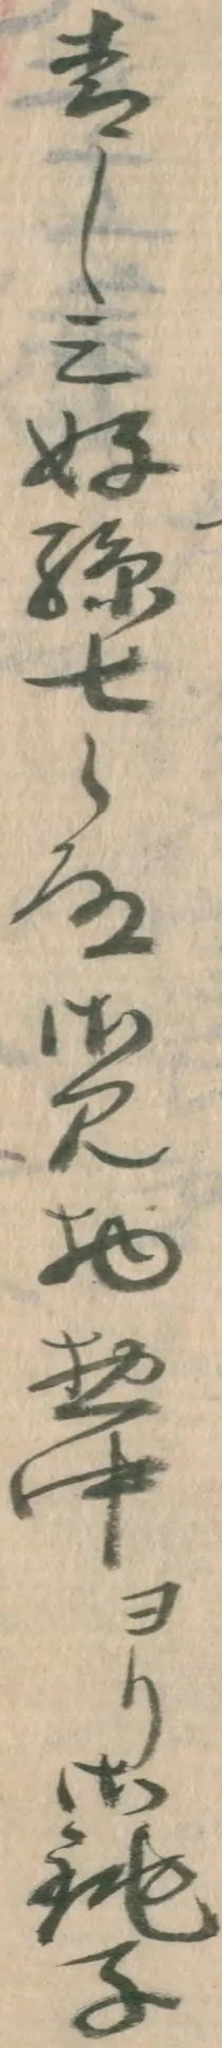青し三好孫七郎殿御見物惣中ヨリ御銚子
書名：賀茂社記録. 第10冊
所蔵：国立国会図書館 National Diet Library, JAPAN
